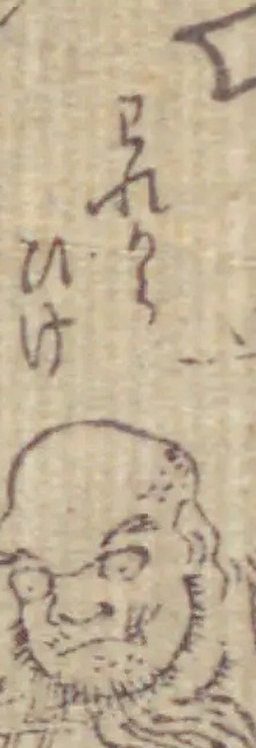われから
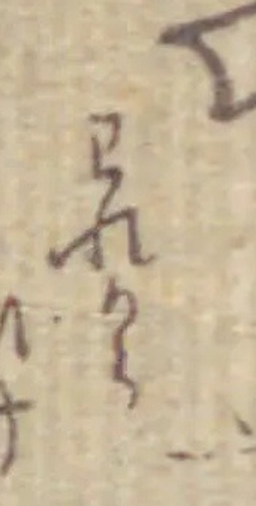われから
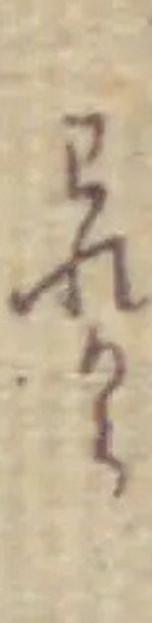われから
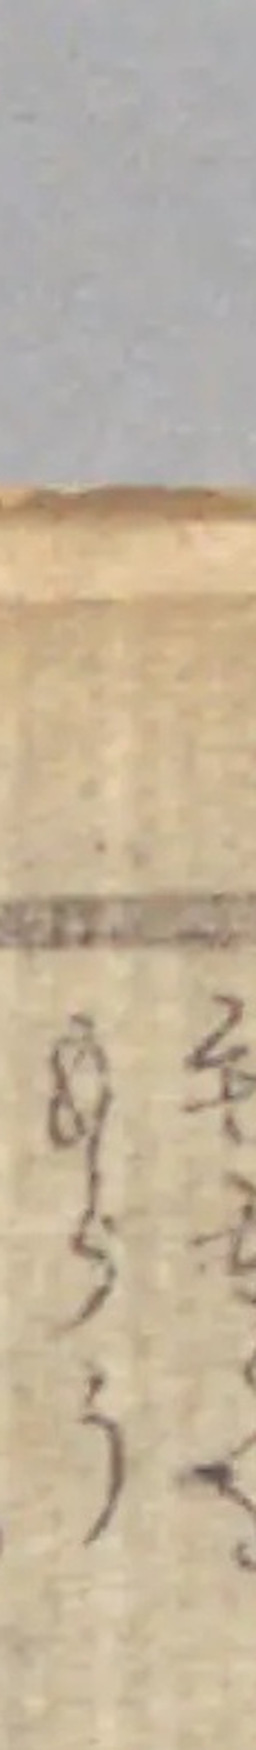もらう
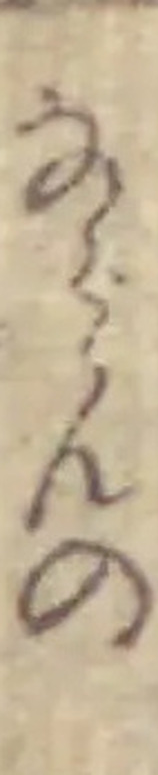ならんの
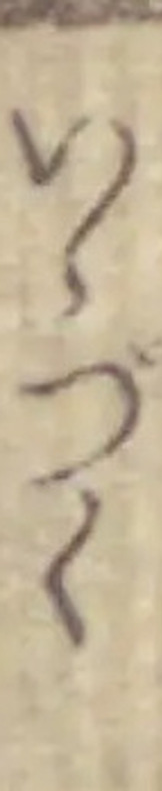いゝづく
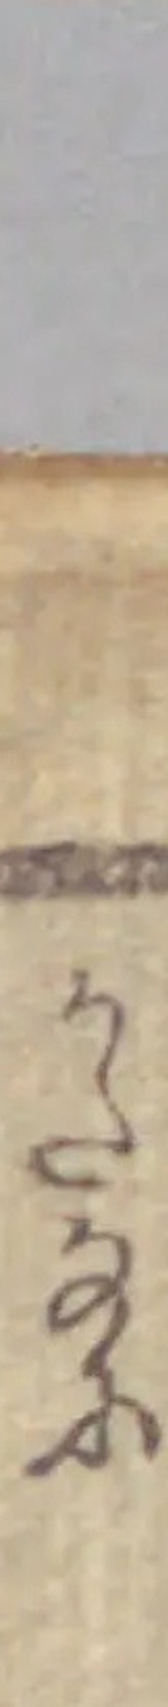かたなに
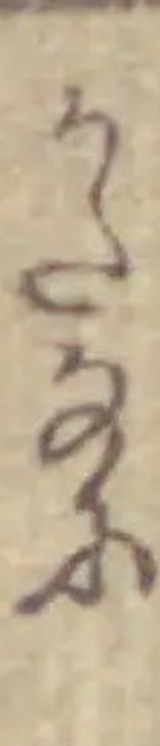かたなに
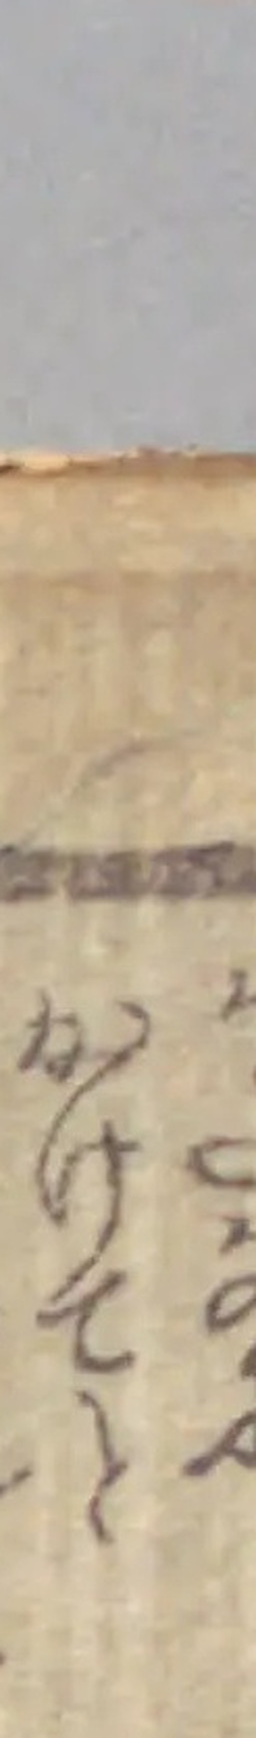かけてと
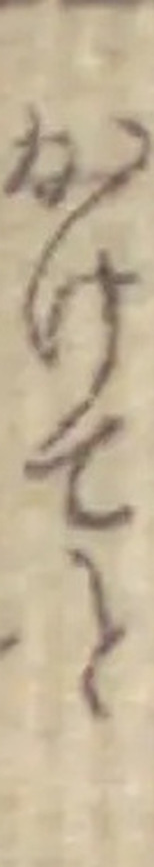かけてと
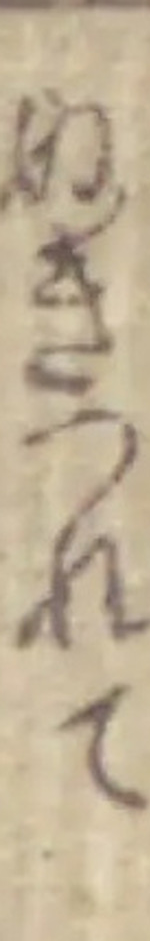ぬきつれて
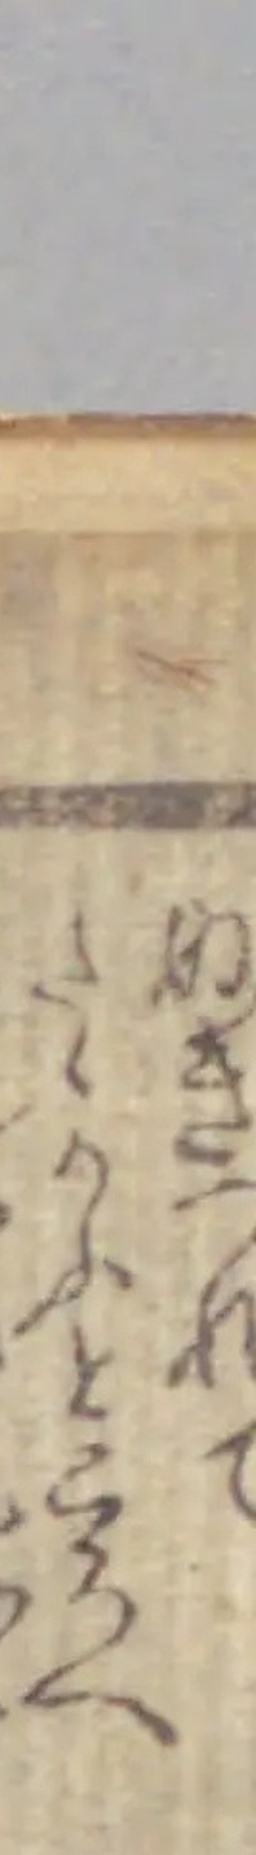たゝかふところへ
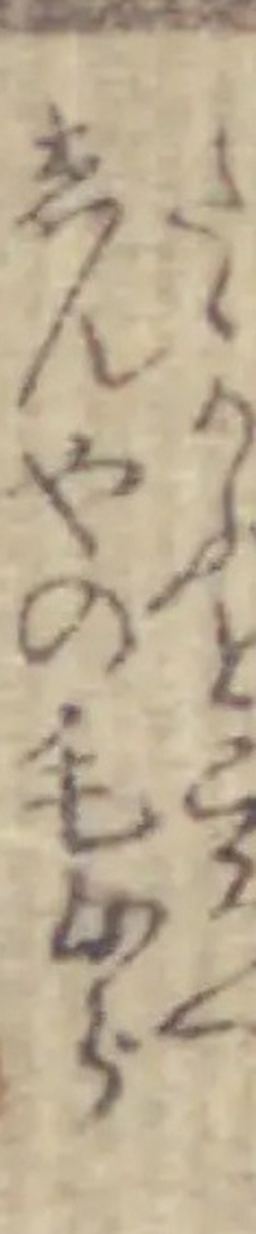しんやの毛女郎
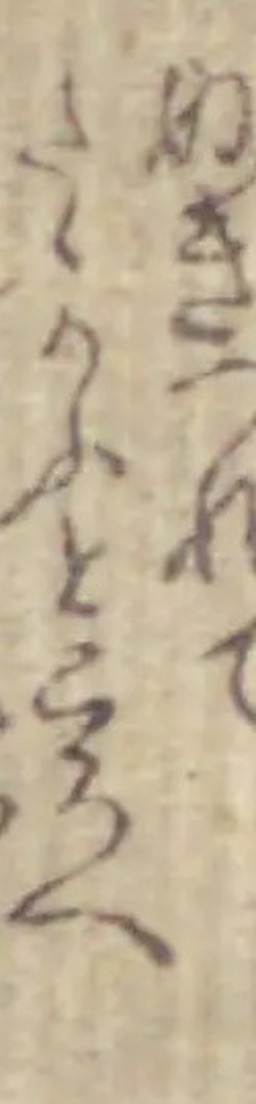たゝかふところへ
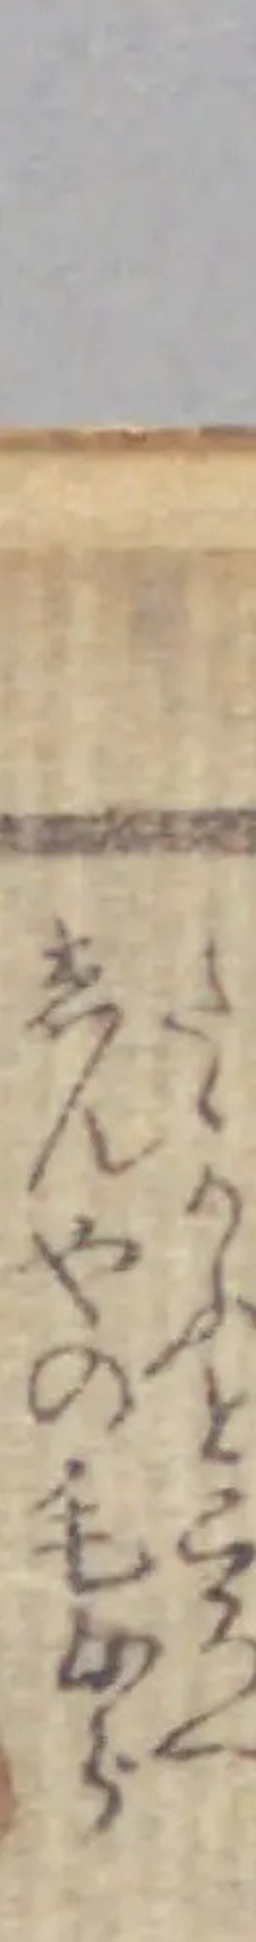しんやの毛女郎
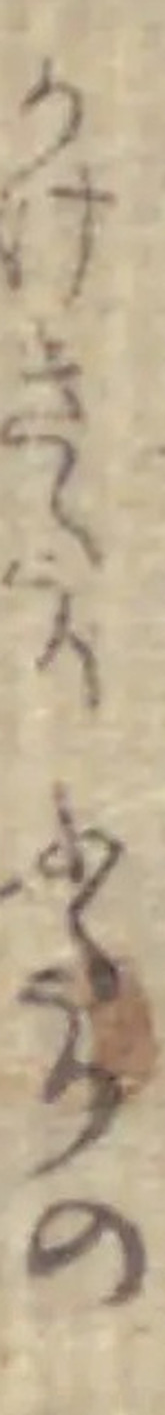かけきたりふたりの
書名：大昔化物双紙 2巻
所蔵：国立国会図書館 National Diet Library, JAPAN
